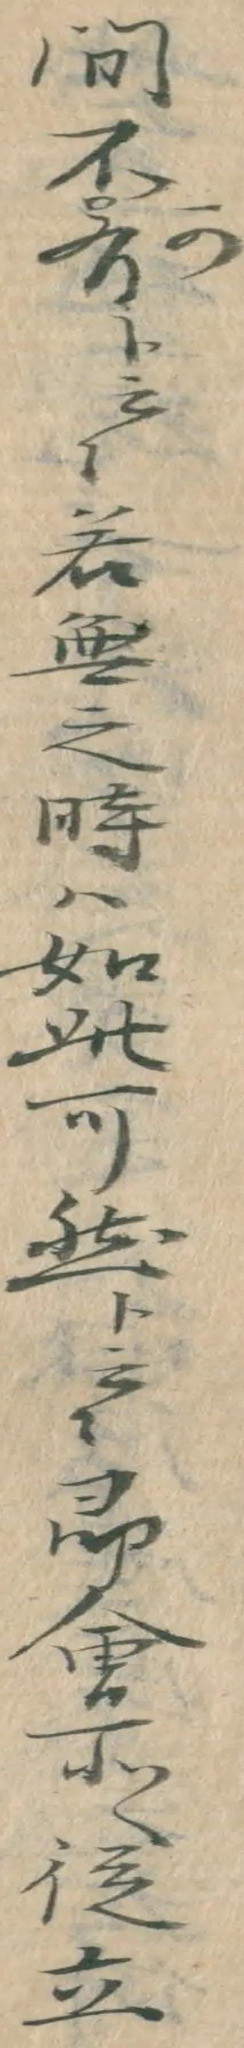間不￮有ト云々若無之時ハ如此可然ト云々即会所ヘ従立
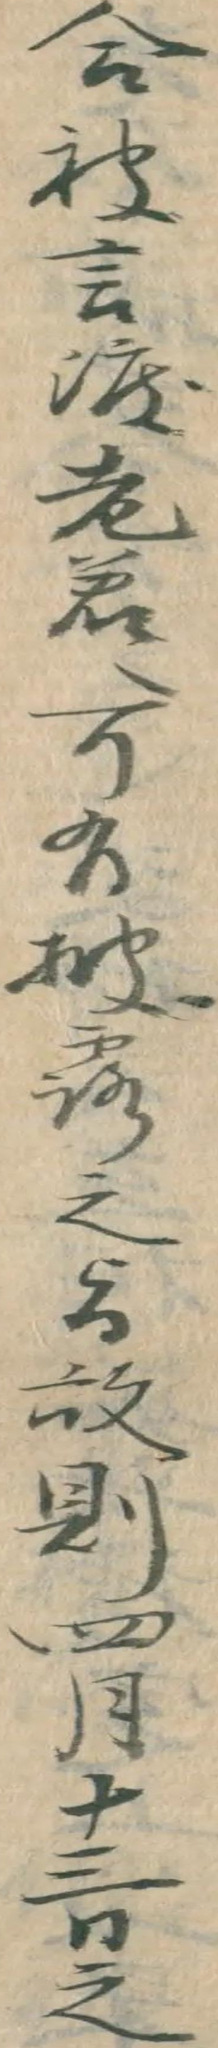合被言渡老若ヘ可有披露之旨故則四月十三日之

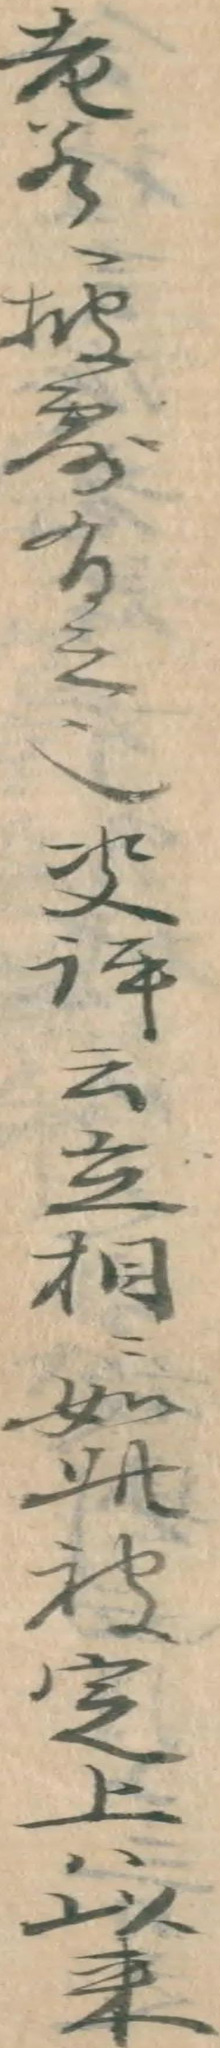老若ヘ披露有之也決評云立相ニ如此被定上ハ以来
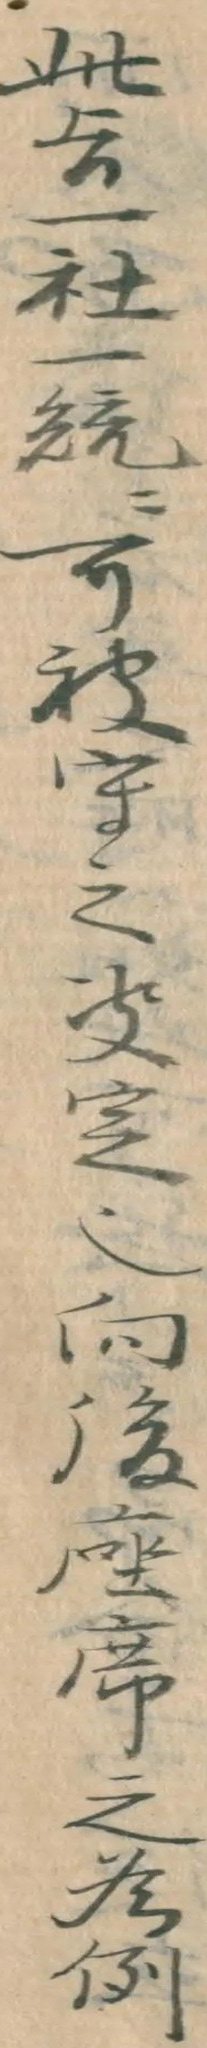此旨一社一統ニ可被守之決定也向後座席之為例
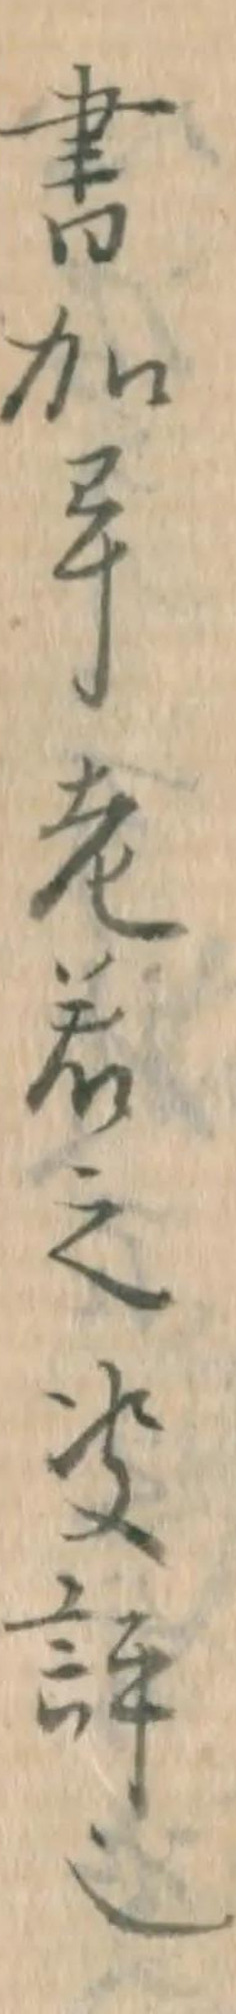書加畢老若之決評也
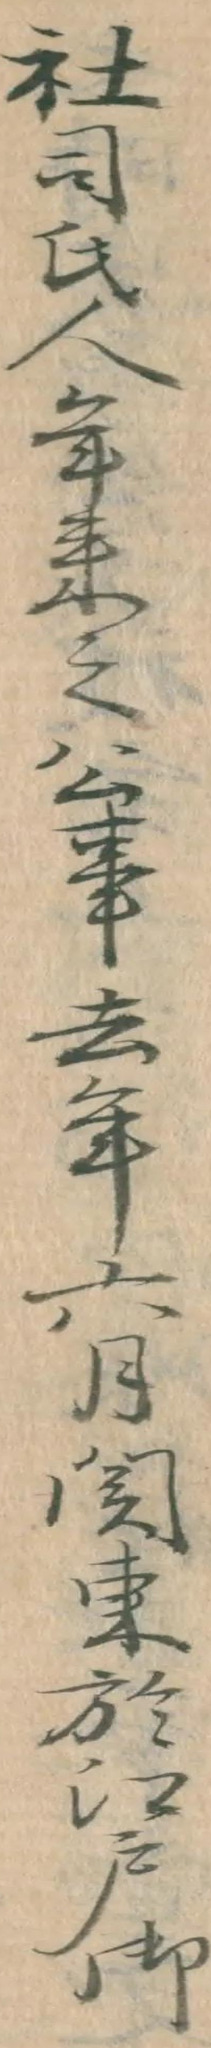社司氏人年来之公事去年六月関東於江戸御
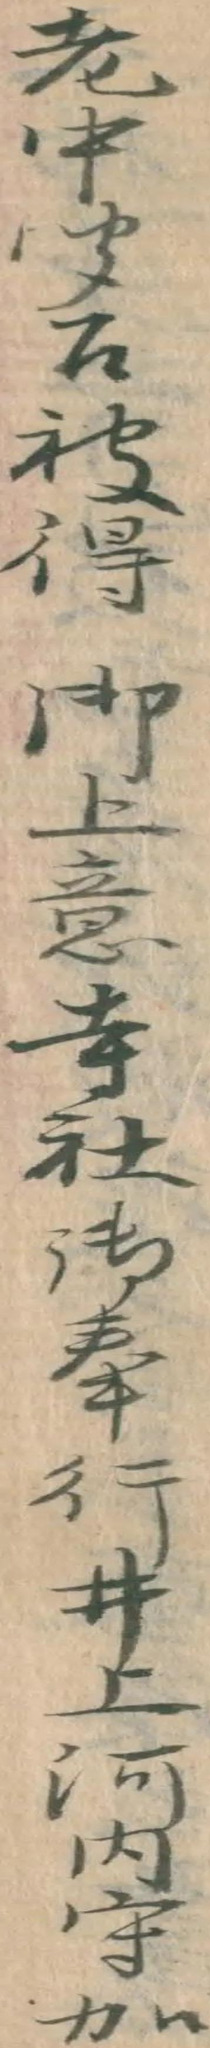老中聞召被得御上意寺社御奉行井上河内守加
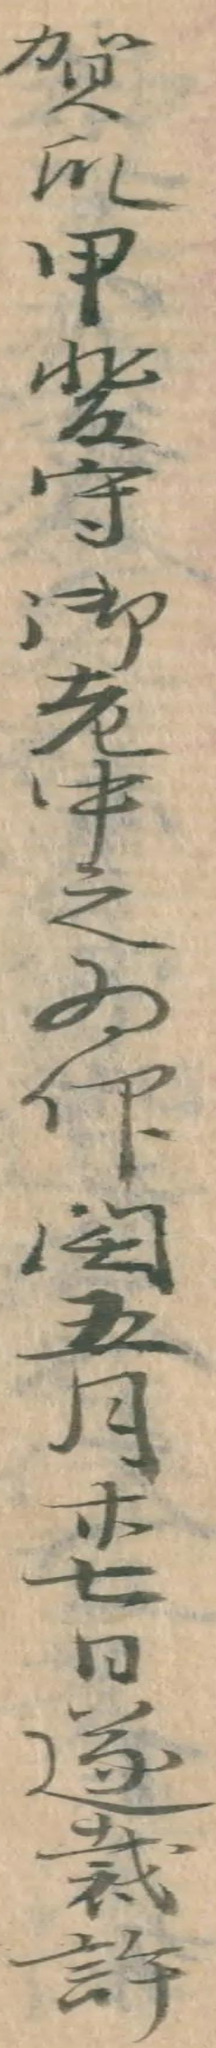賀爪甲斐守御老中之為仰閏五月廿七日遂裁許
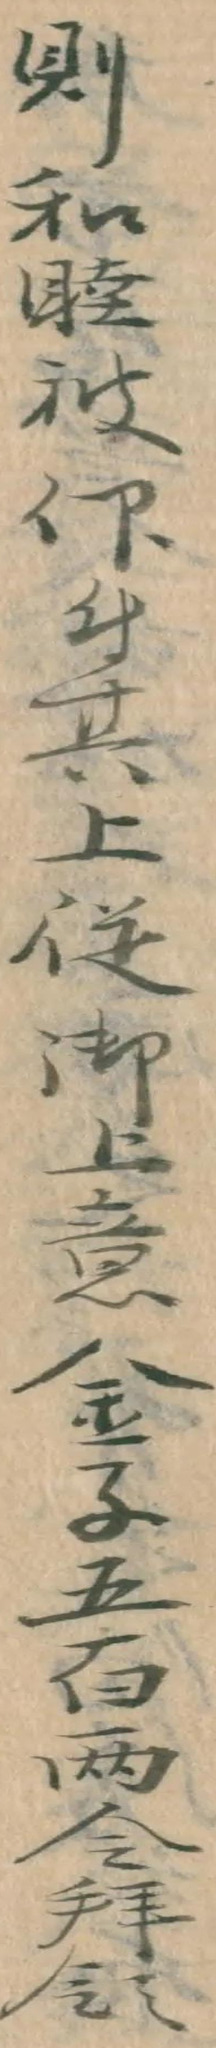則和睦被仰付其上従御上意金子五百両令拝領
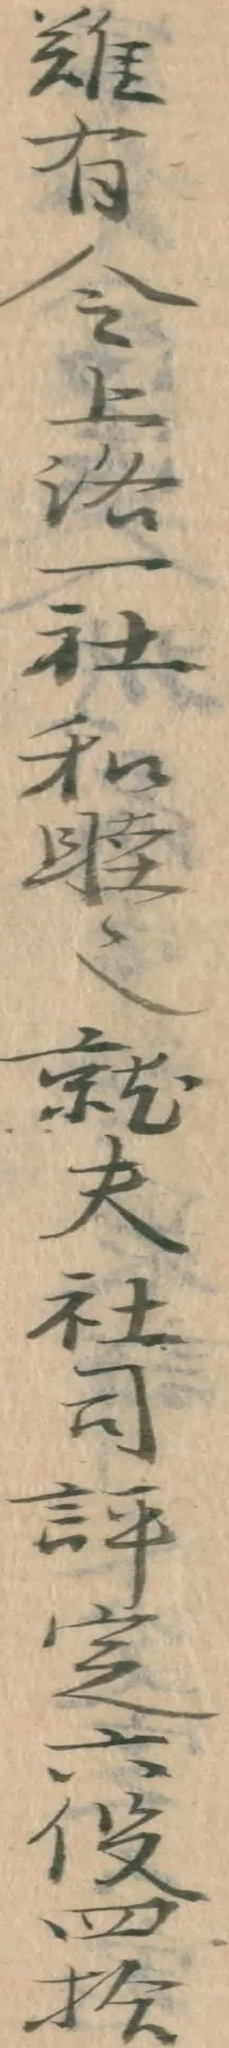難有令上洛一社和睦也就夫社司評定六役四拾
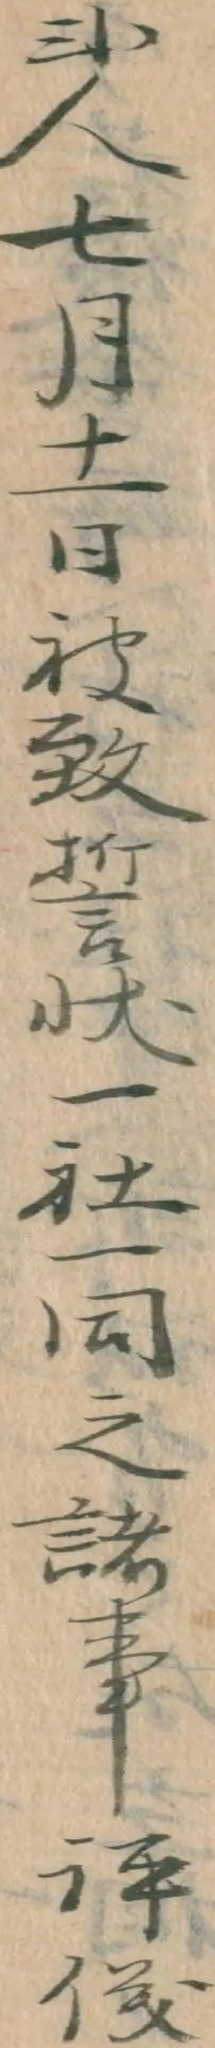弐人七月十一日被致誓状一社一同之諸事評儀
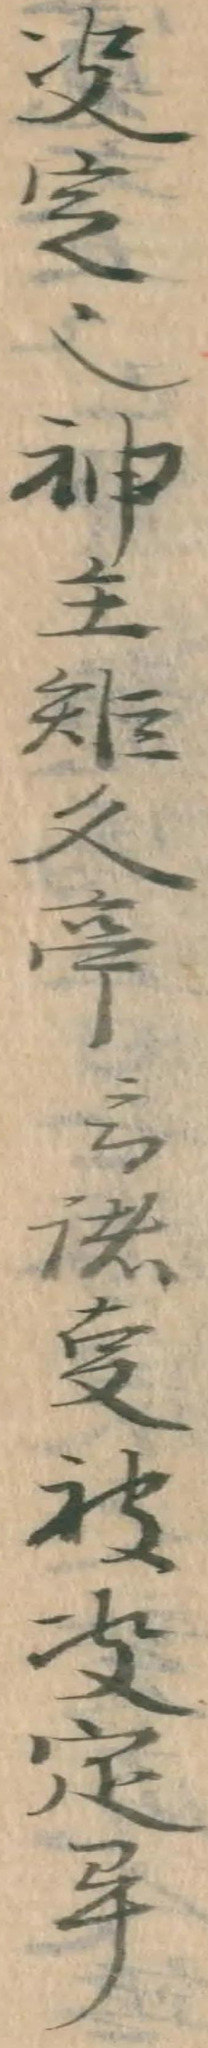決定也神主矩久亭ニ而諸事被決定畢
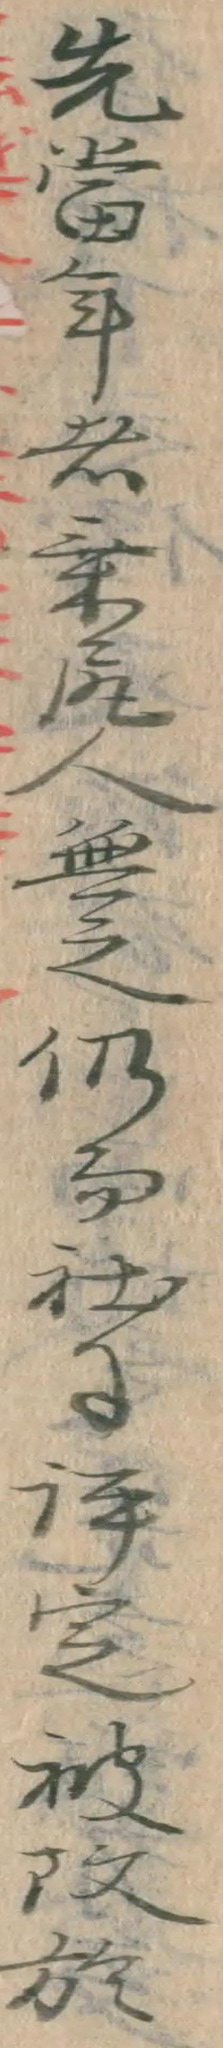先当年者乗尻人無之仍而社に評定被改於
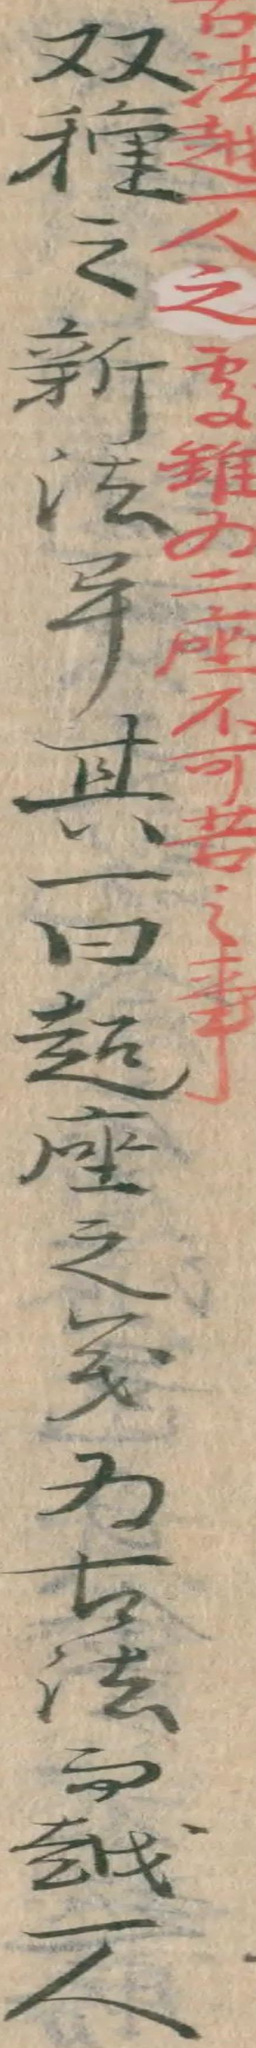双種之新法畢其一曰越座之義為古法而越一人
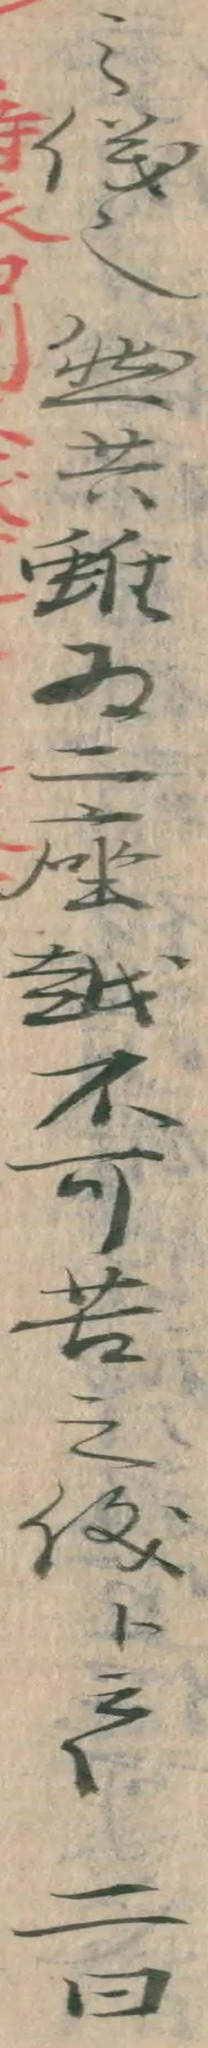之儀也然共雖為二座越不可苦之儀ト云々二曰
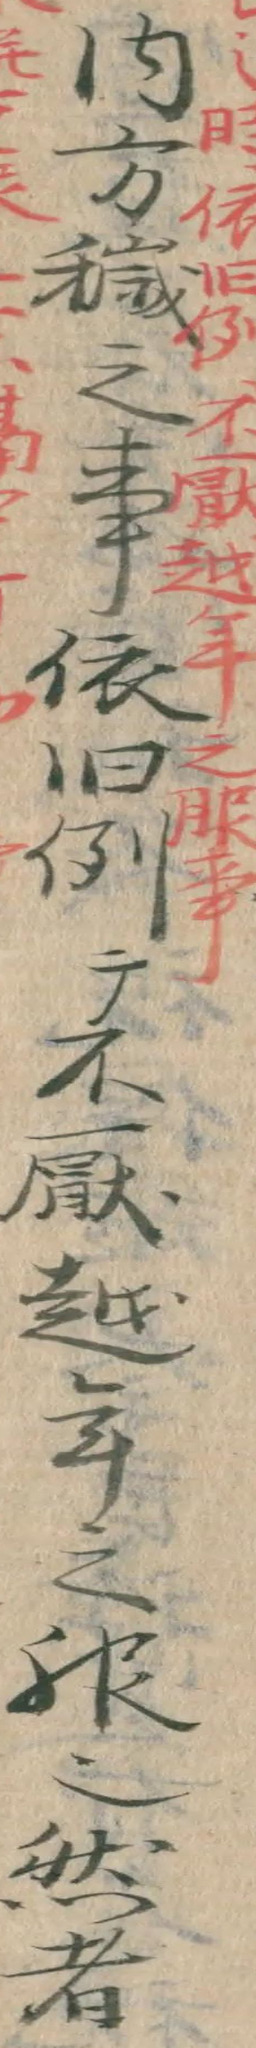内方穢之事依旧例テ不厭越年之服也然者
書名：賀茂社記録. 第10冊
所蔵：国立国会図書館 National Diet Library, JAPAN
